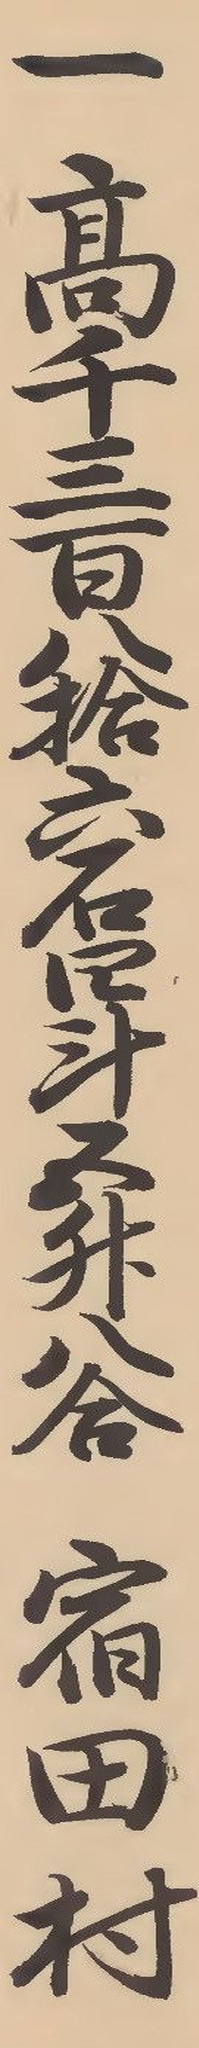一高千三百八拾六石四斗五升八合宿田村
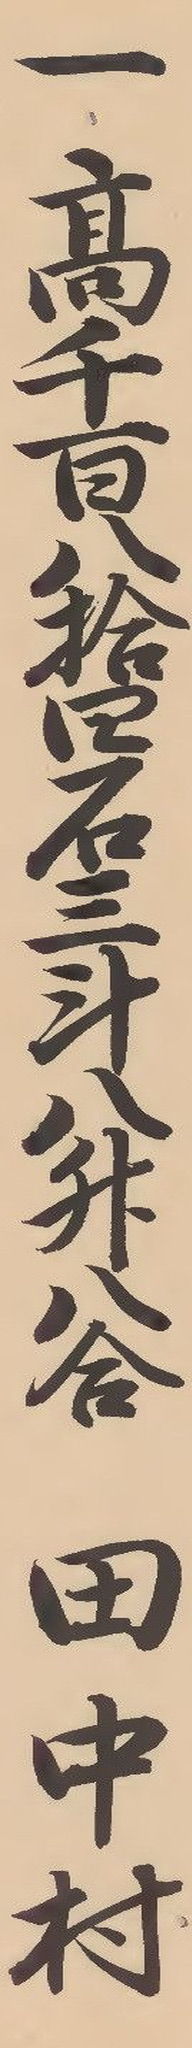一高千百八拾四石三斗八升八合田中村
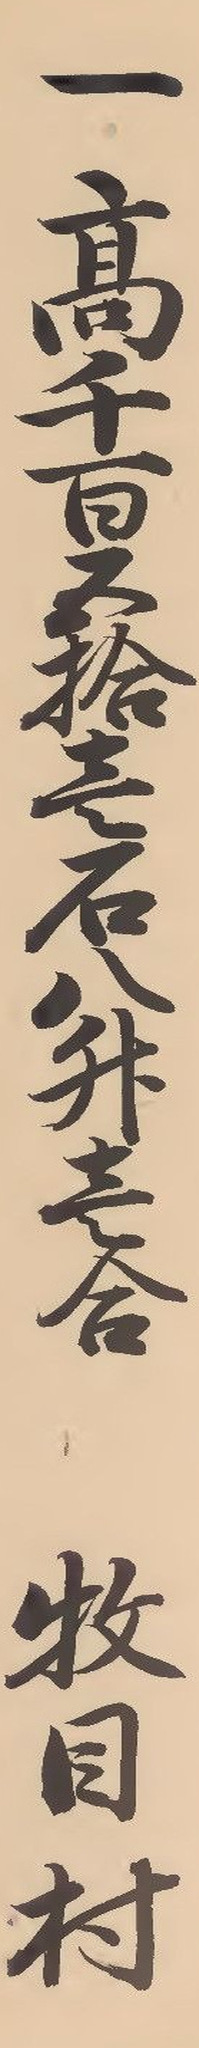一高千百五拾壱石八升壱合牧目村
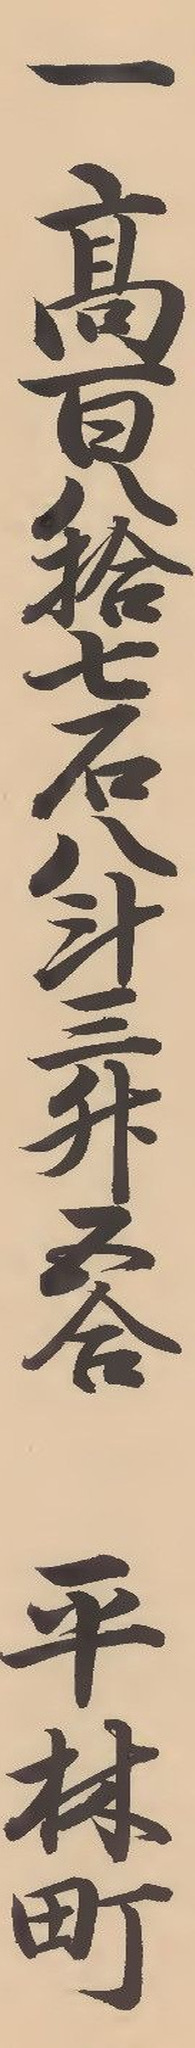一高百八拾七石八斗三升五合平林町
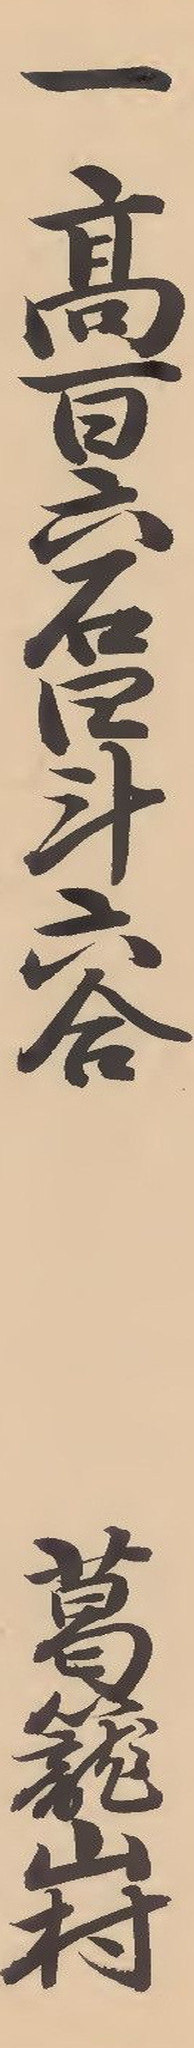一高百六石四斗六合葛篭山村
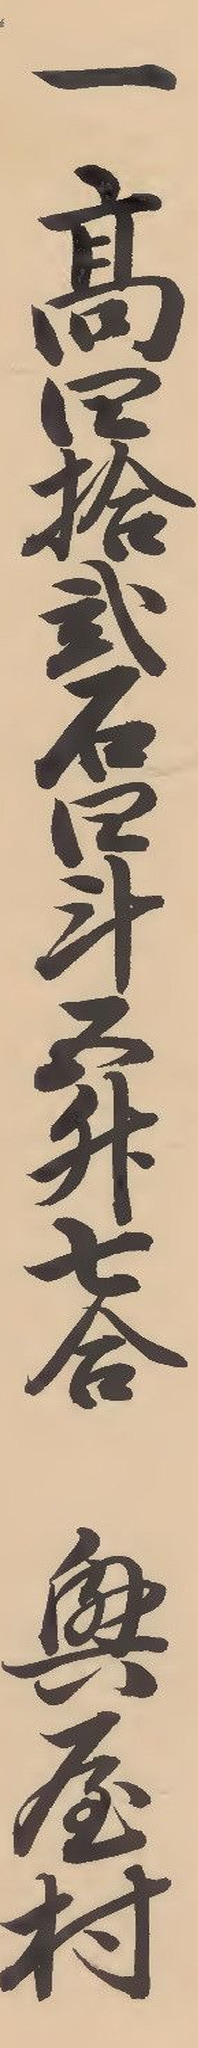一高四拾弐石四斗五升七合興屋村

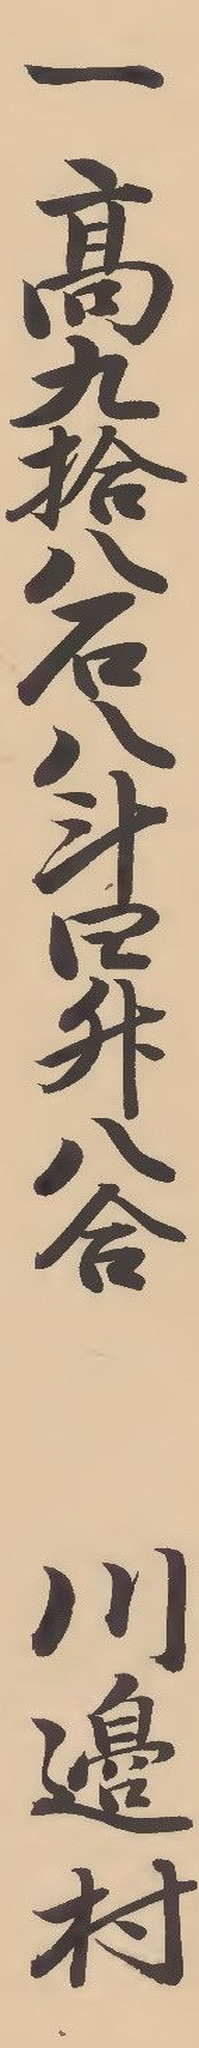一高九拾八石八斗四升八合川辺村
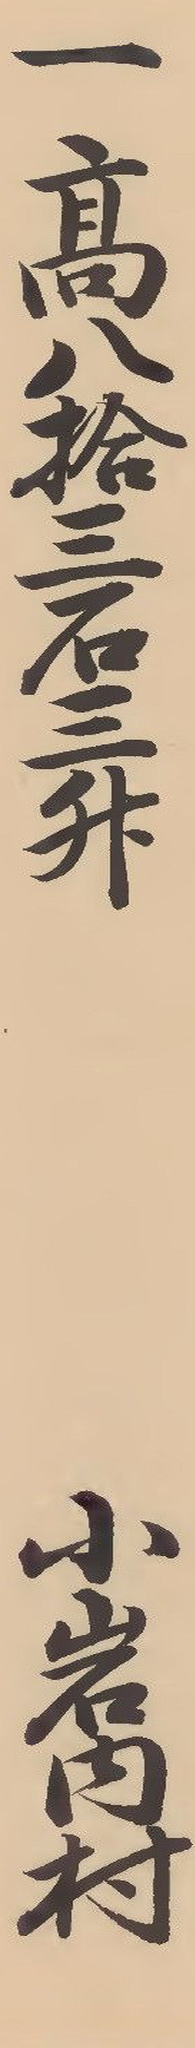一高八拾三石三升小岩内村
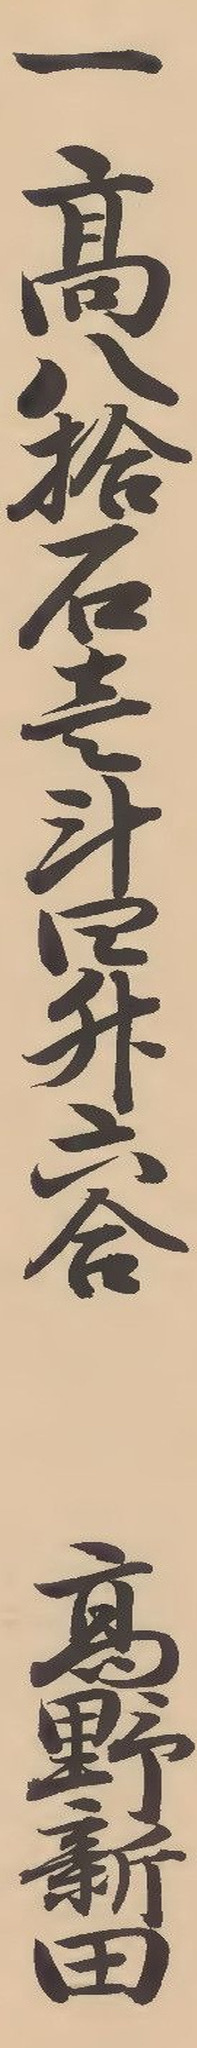一高八拾石壱斗四升六合高野新田
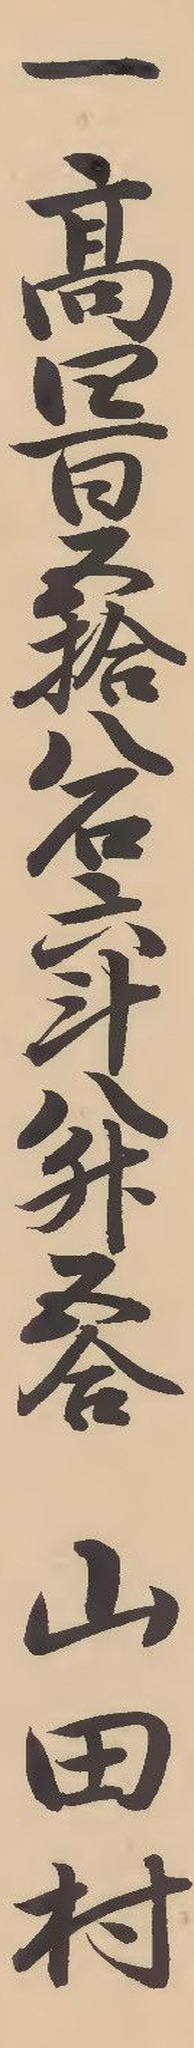一高四百五拾八石六斗八升五合山田村
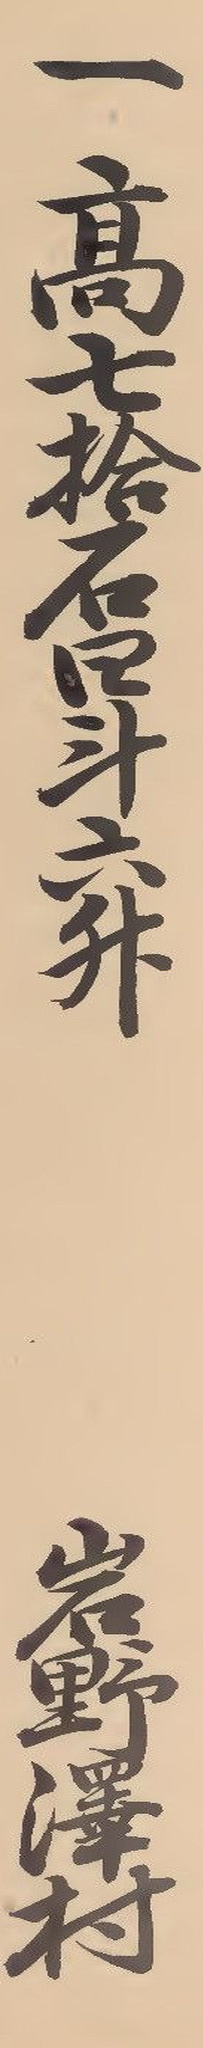一高七拾石四斗六升岩野沢村
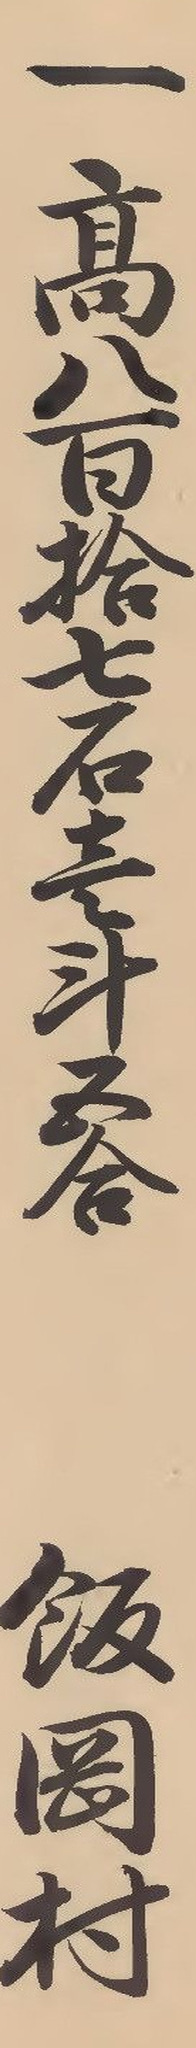一高八百拾七石壱斗五合飯岡村
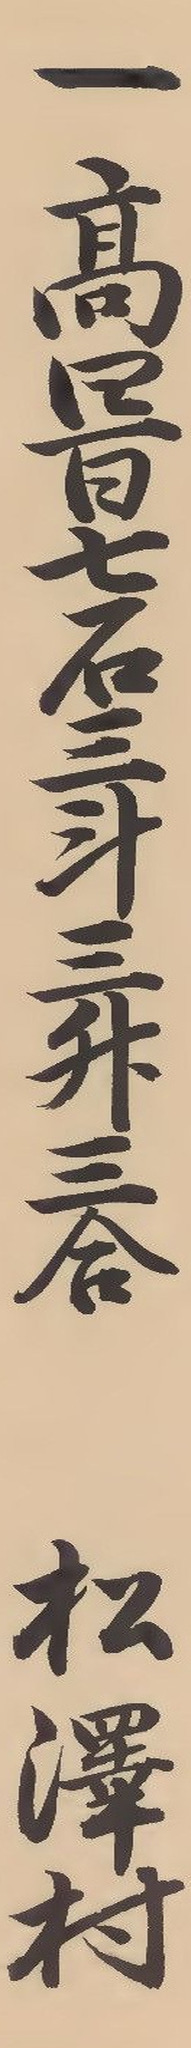一高四百七石三斗三升三合松沢村
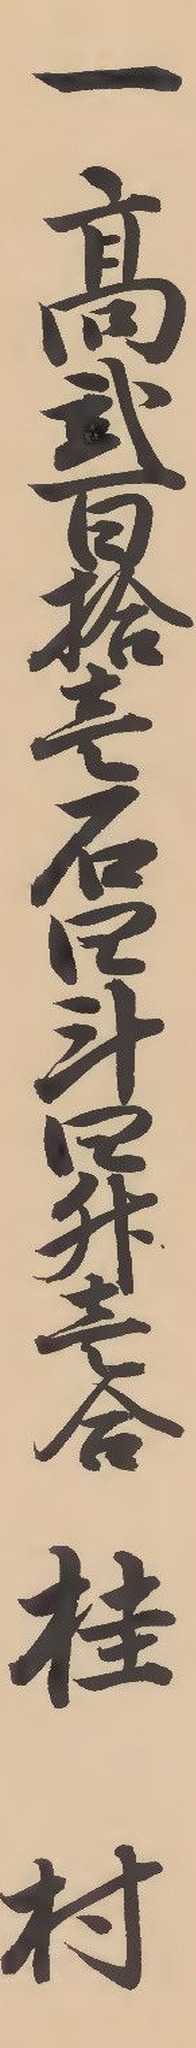一高弐百拾壱石四斗四升壱合桂村

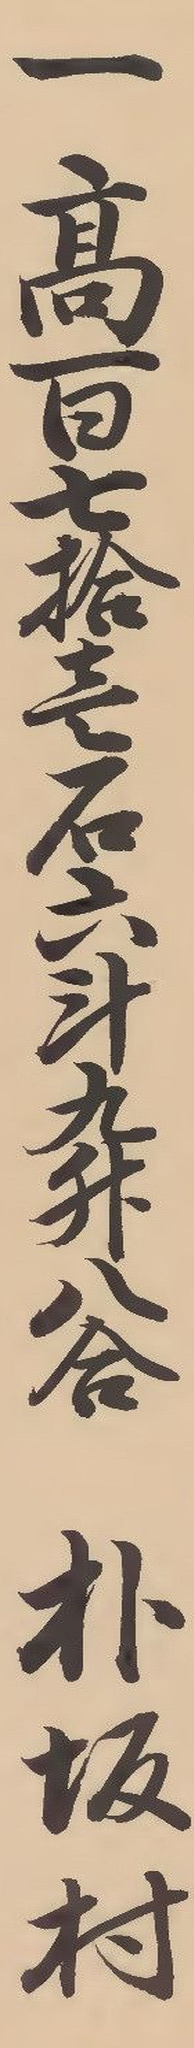一高百七拾壱石六斗九升八合朴坂村
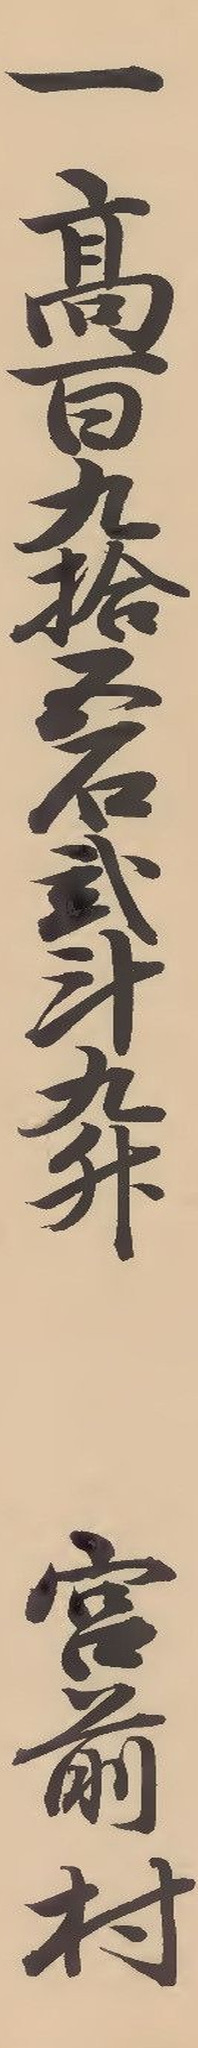一高百九拾五石弐斗九升宮前村
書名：越後国郷帳　下
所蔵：国立公文書館 National Archives of Japan
